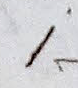1
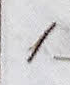1
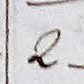2
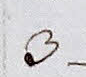3
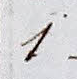1
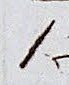1
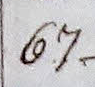67
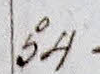54
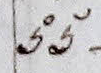55
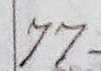77
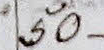50
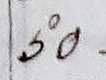50
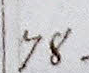78
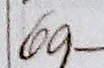69
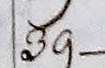39
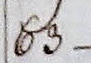63
